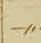800.
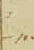500.
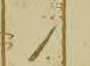1.
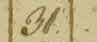31.
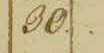30.
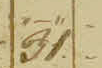31.
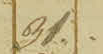31.
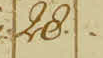28.
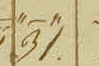31.
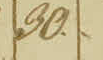30.
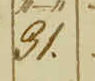31.
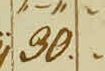30.
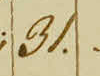31.
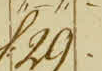29
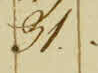31.
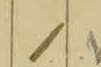1.
